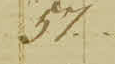57.
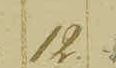12.
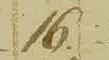16.
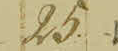25.
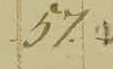57.
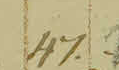47.
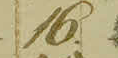16.
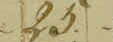25.
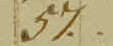57.
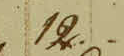12.
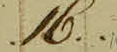16.
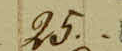25.
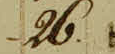26.
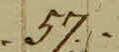57.
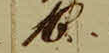16.
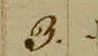3.
